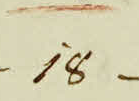18
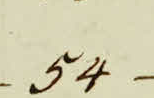54
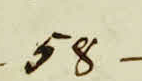58
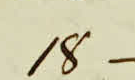18
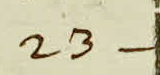23
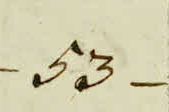53
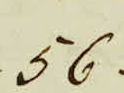56
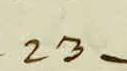23
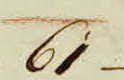61
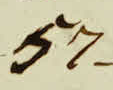57
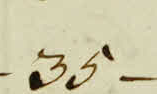35
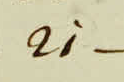21
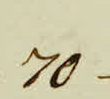70
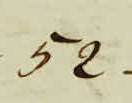52
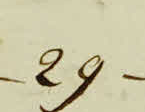29
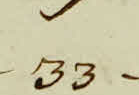33
